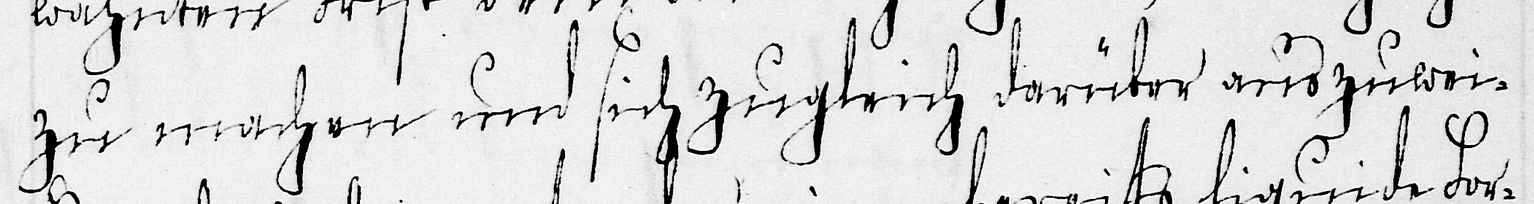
zu machen und sich zugleich darüber auszuwei¬
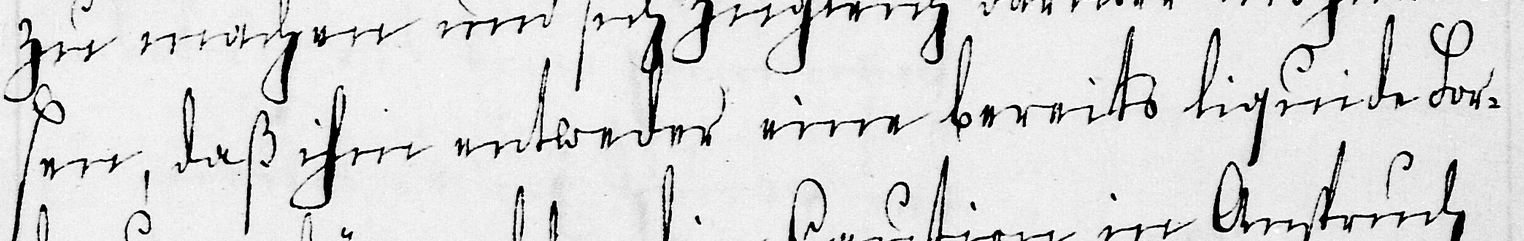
sen, daß ihm entweder eine bereits liquide For¬
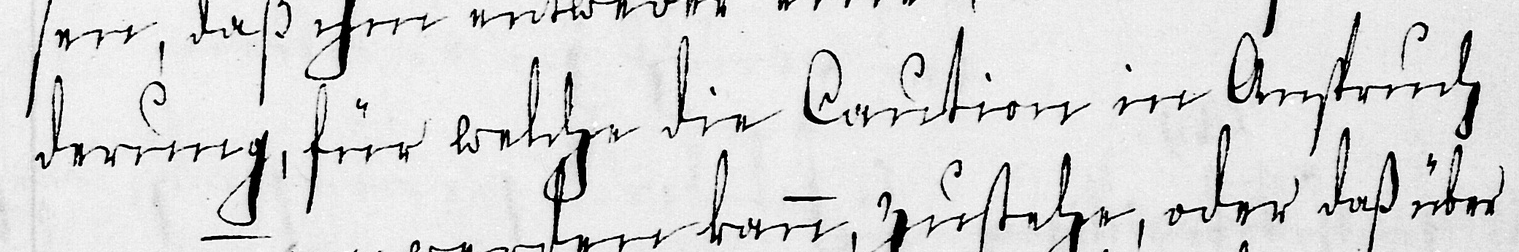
derung, für welche die Caution in Anspruch
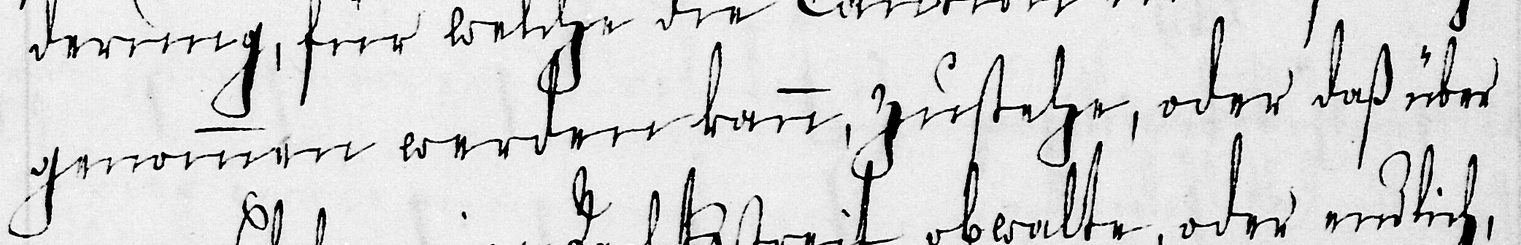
genommen werden kann, zustehe, oder daß über
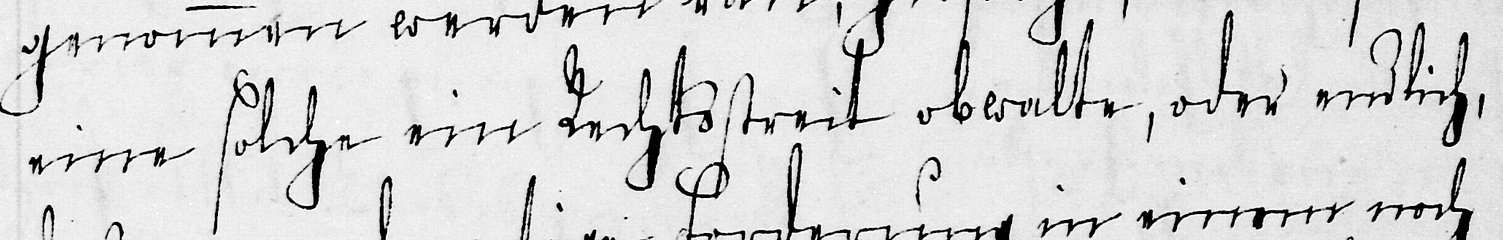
eine solche ein Rechtsstreit obwalte, oder endlich,
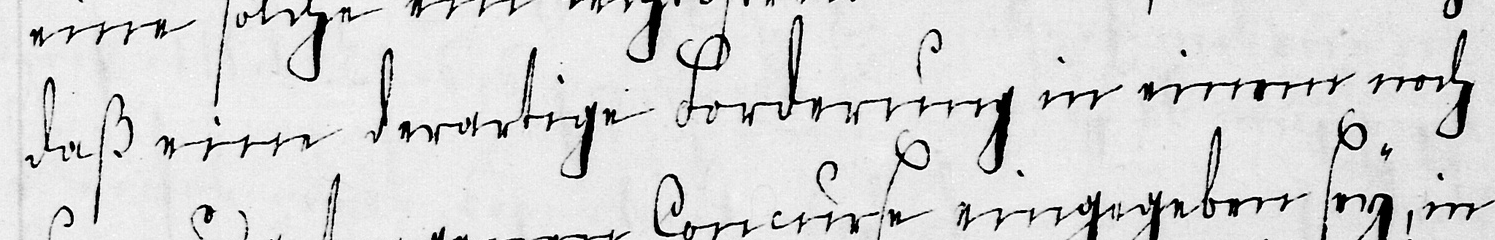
daß eine derartige Forderung in einem noch
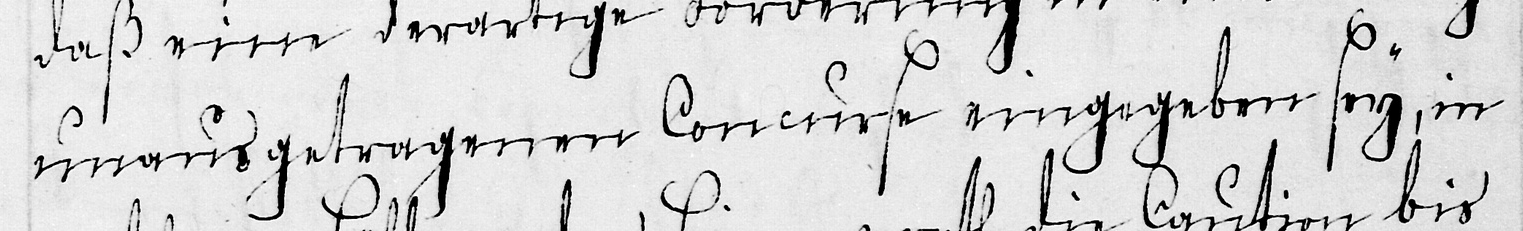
unausgetragenen Concurse eingegeben sey, in
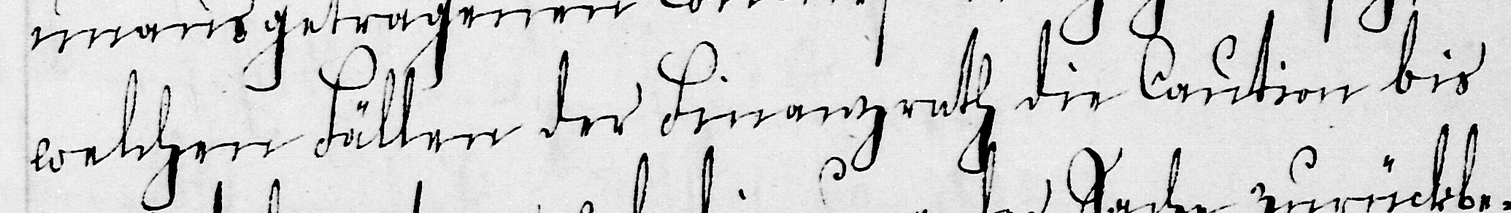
welchen Fällen der Finanzrath die Caution bis
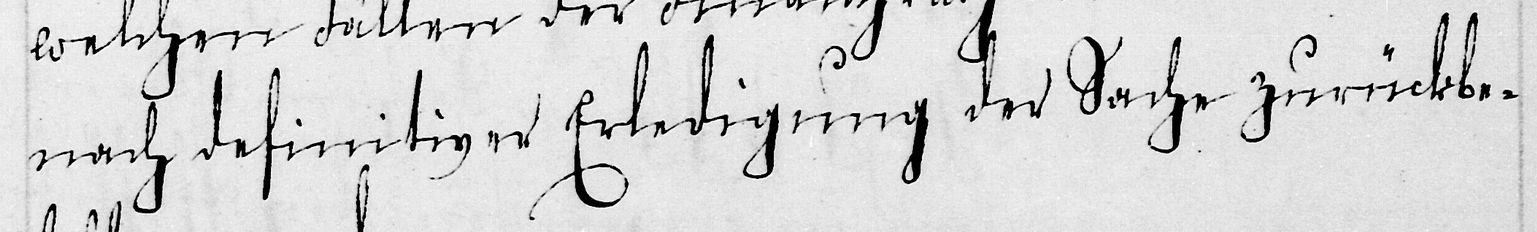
nach definitiver Erledigung der Sache zurückbe¬
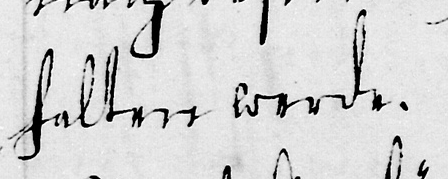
halten werde.
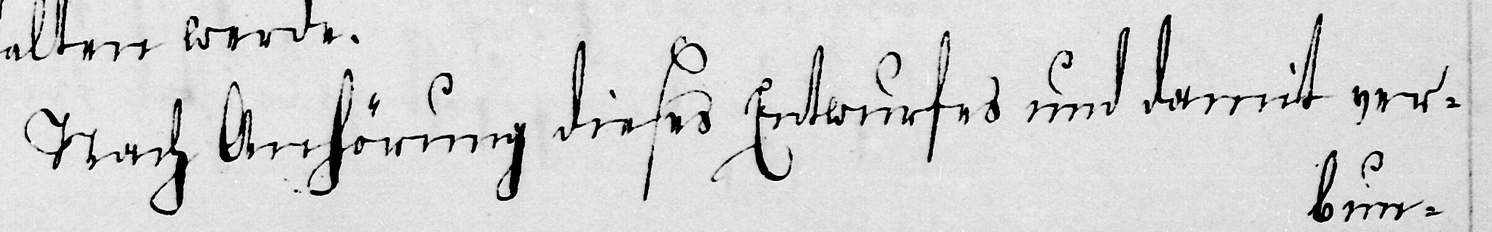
Nach Anhörung dieses Entwurfes und damit ver-
